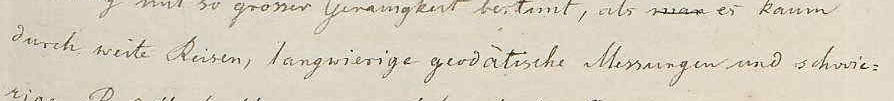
durch weite Reisen, langwierige geodätische Messungen und schwie-
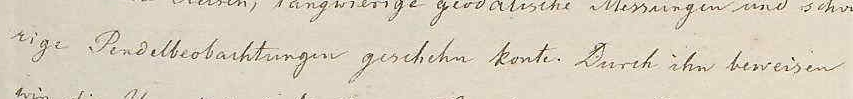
rige Pendelbeobachtungen geschehen konte. Durch ihn beweisen
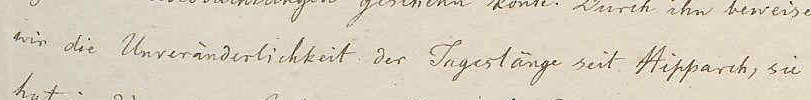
wir die Unveränderlichkeit der Tageslänge seit Hipparch, sie
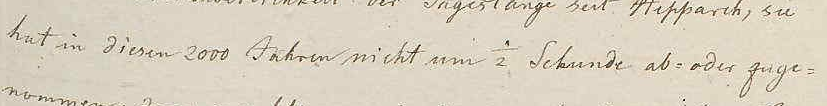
hat in diesen 2000 Jahren nicht um ½ Sekunde ab- oder zuge-
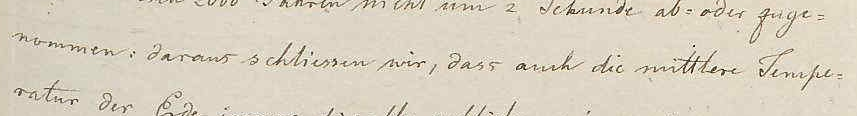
nommen: daraus schliessen wir, dass auch die mittlere Tempe-
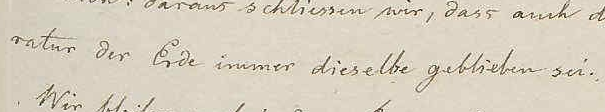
ratur der Erde immer dieselbe geblieben sei.
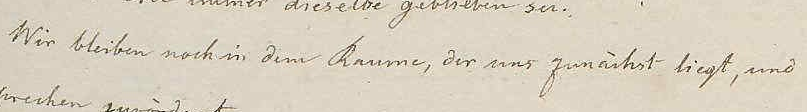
Wir bleiben noch in dem Raume, der uns zunächst liegt, und
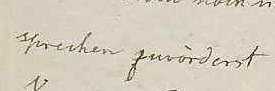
sprechen zuvörderst
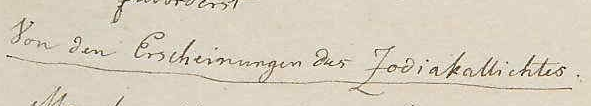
Von den Erscheinungen des Zodiakallichtes.
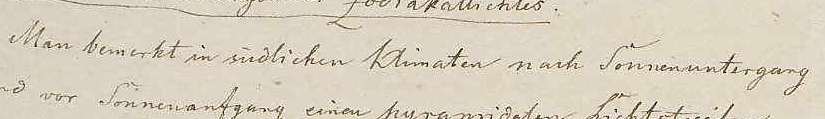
Man bemerkt in südlichen Klimaten nach Sonnenuntergang
